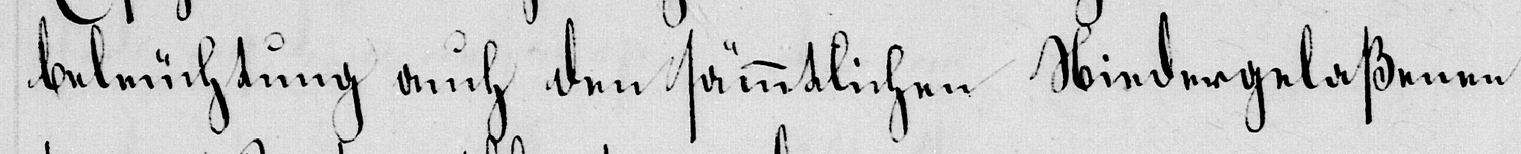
beleuchtung auch den sämmtlichen Niedergelaßenen
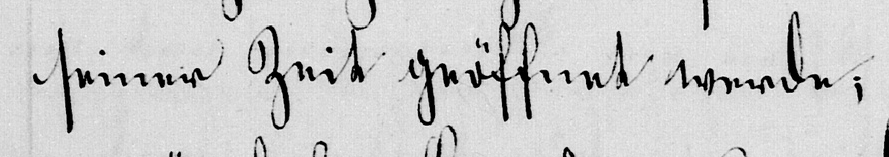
seiner Zeit geöffnet werde;
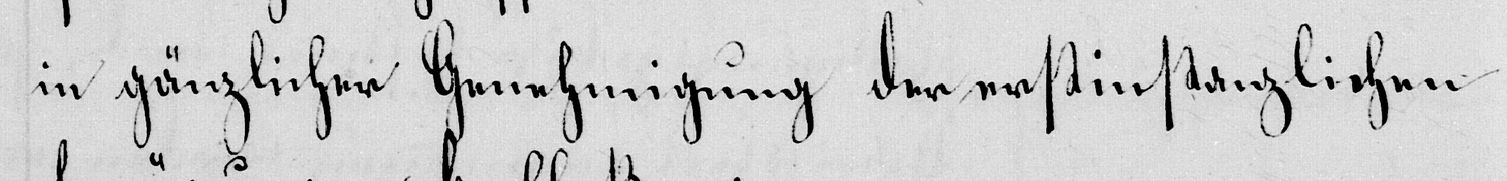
in gänzlicher Genehmigung der erstinstanzlichen
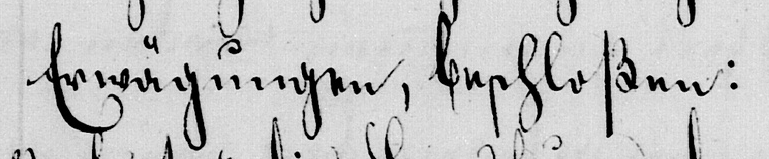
Erwägungen, beschloßen:
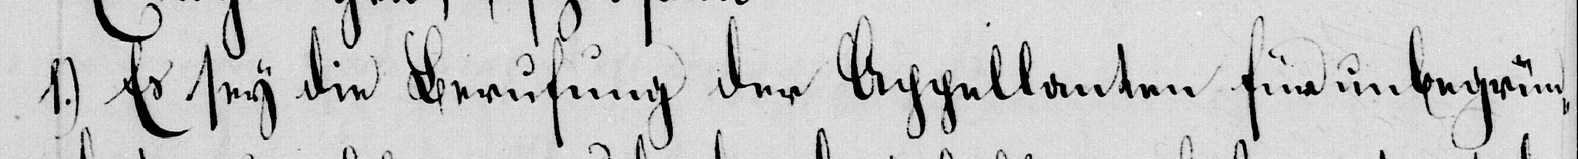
1.) Es sey die Berufung der Appellanten für unbegrün¬
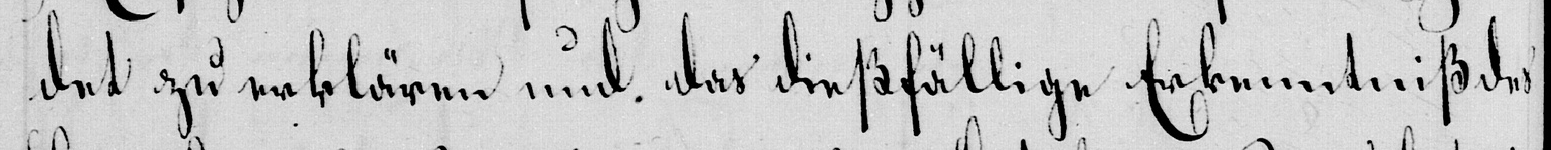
det zu erklären und das dießfällige Erkenntniß des
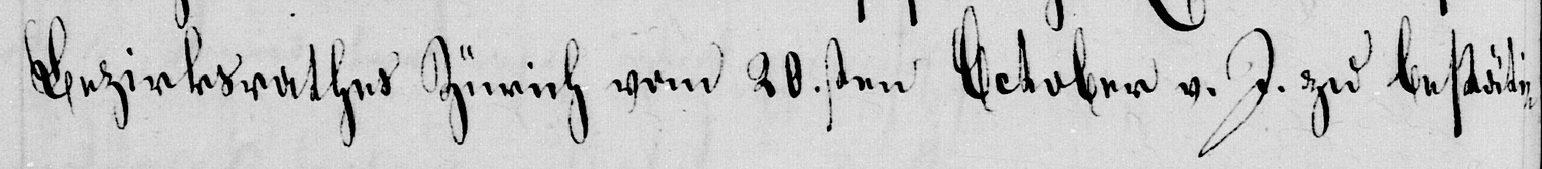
Bezirksrathes Zürich vom 20.sten October v. J. zu bestät¬
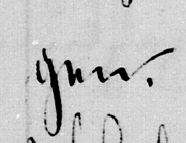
igen.
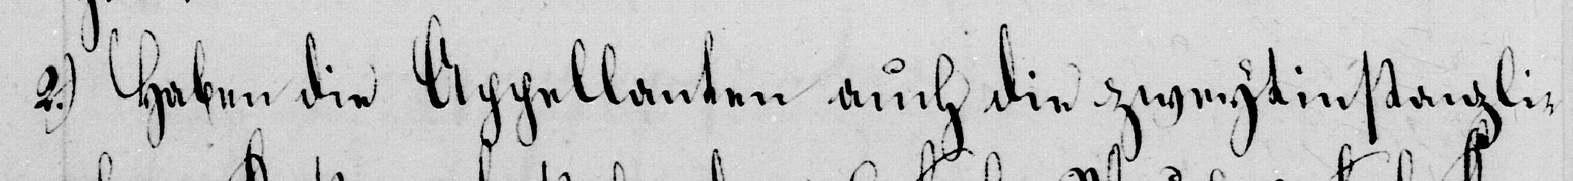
2.) Haben die Appellanten auch die zweytinstanzli¬
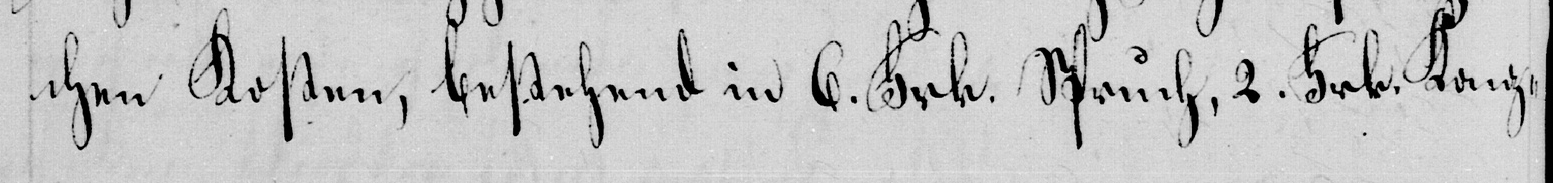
chen Kosten, bestehend in 6. Frk. Spruch, 2. Frk. Kanz-
